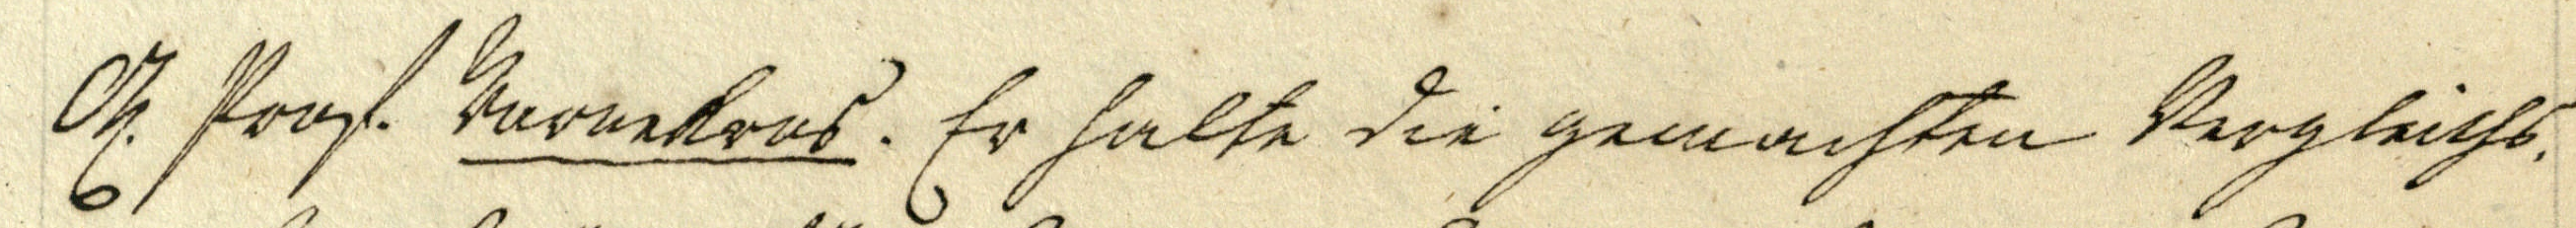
dh. Prof. Warnekros. Er halte die gemachten Vergleichs¬
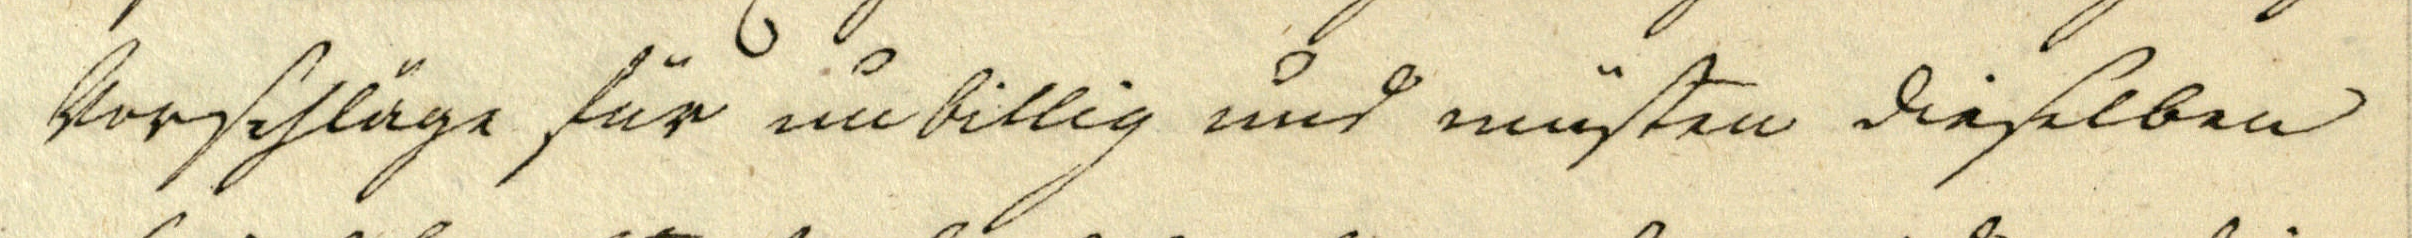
Vorschläge für unbillig und müsten dieselben
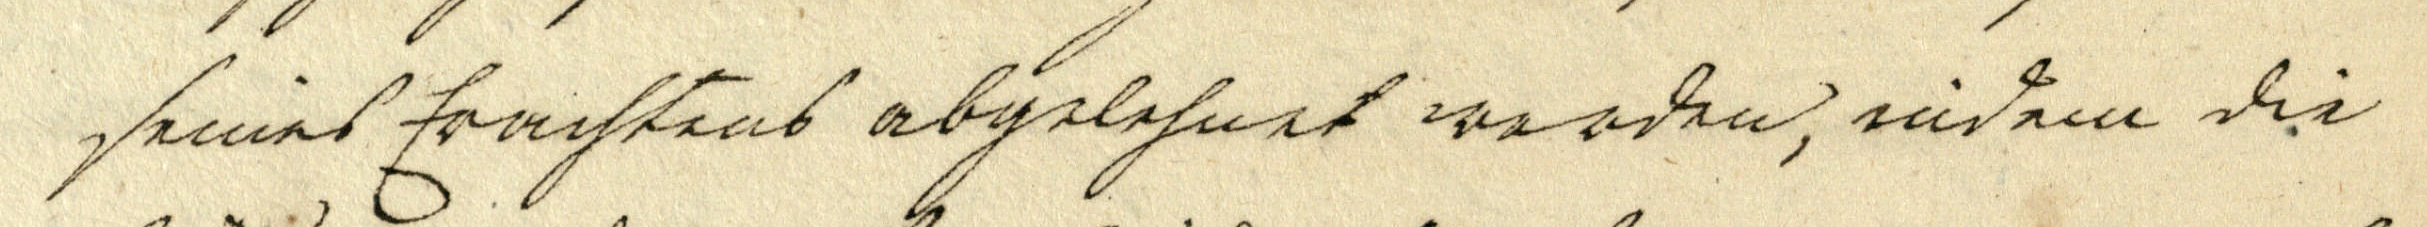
seines Erachtens abgelehnet werden, indem die
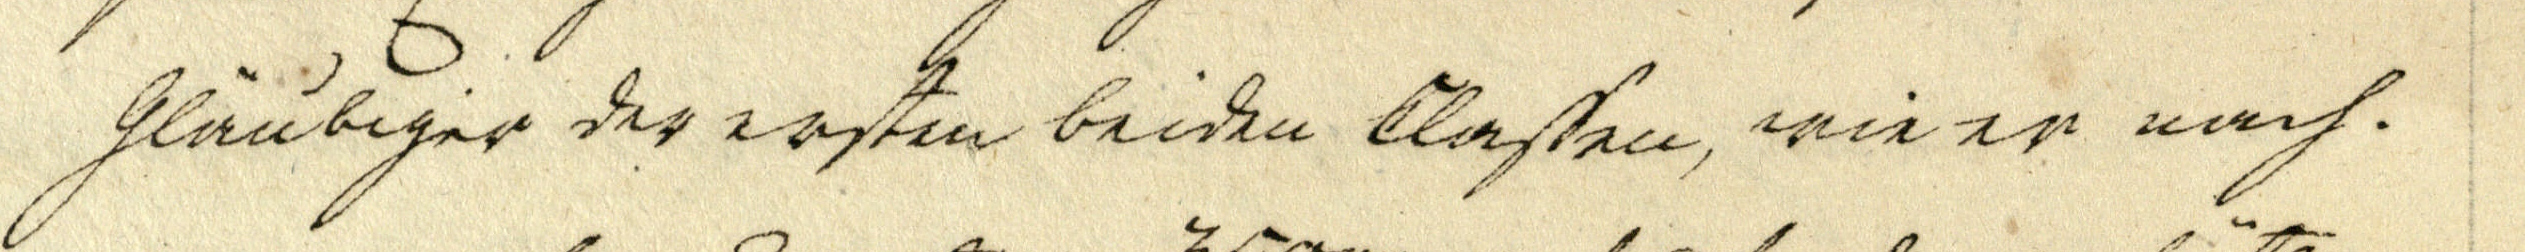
Gläubiger der ersten beiden Classen, wie er nach¬
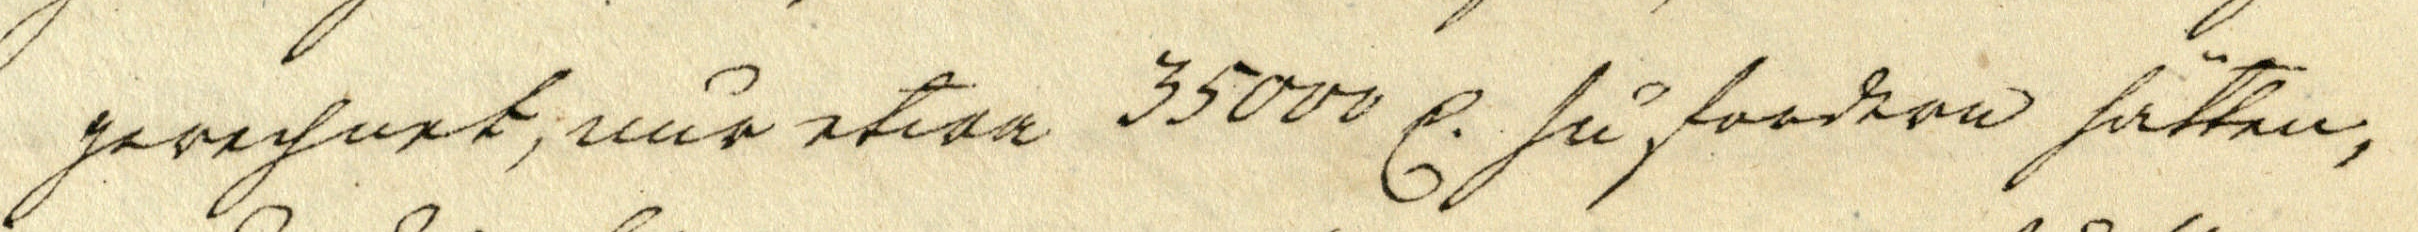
gerechnet, nur etwa 35000 l. zu fordern hätten,
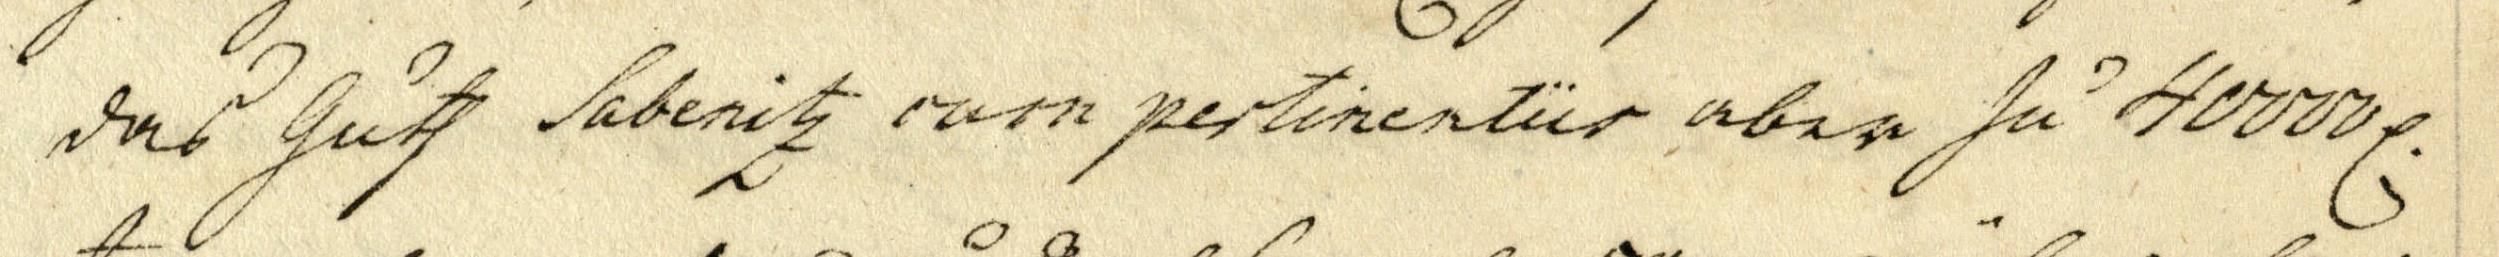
das Guth Sabenitz cum pertinentiis aber zu 40000 l.
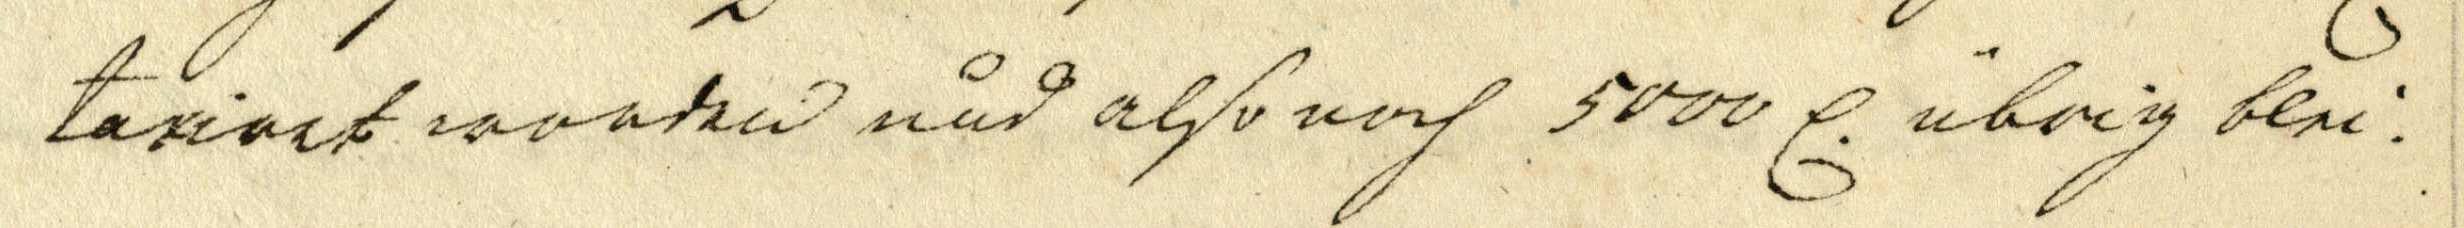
taxiret worden und also noch 5000 l. übrig blei¬
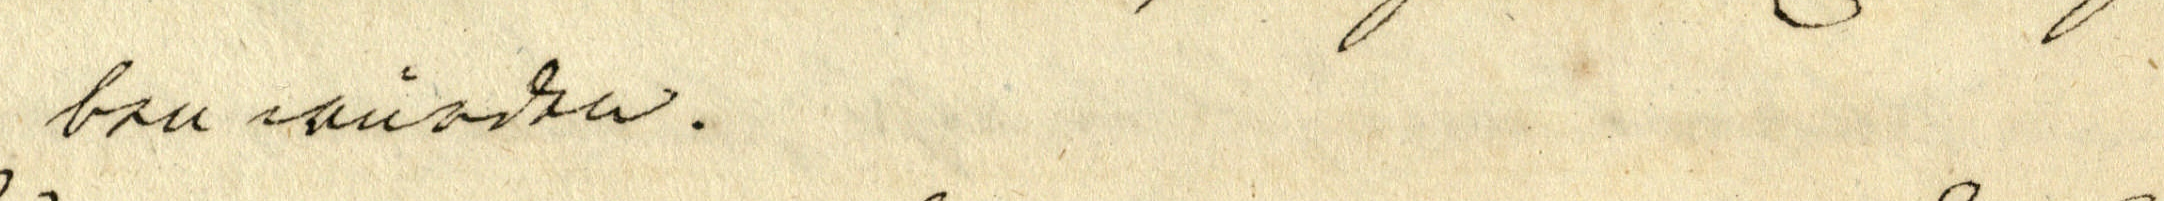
ben würden.
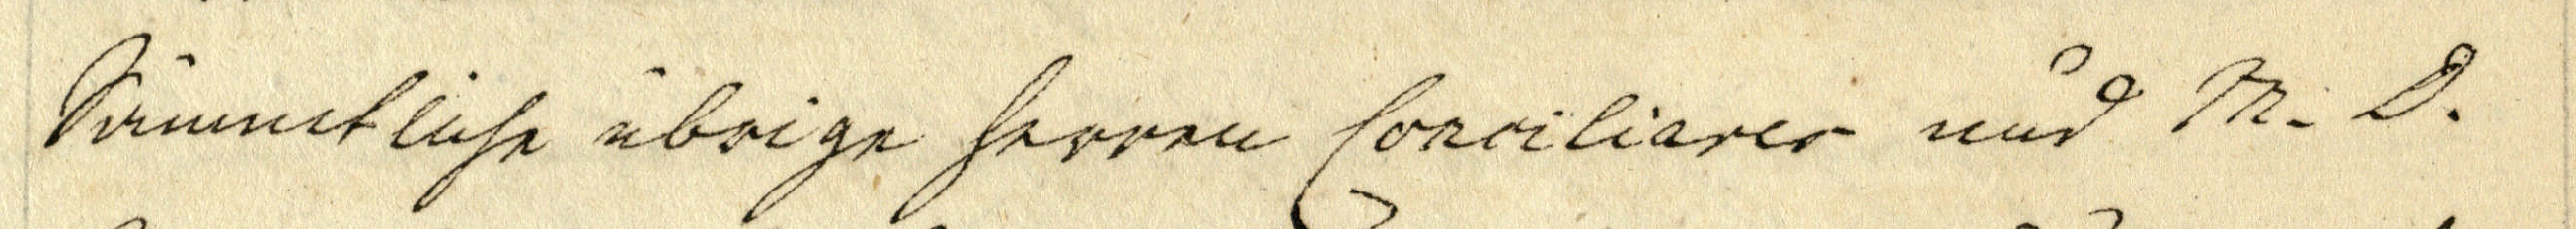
Sämmtliche übrige Conciliares und M. D.
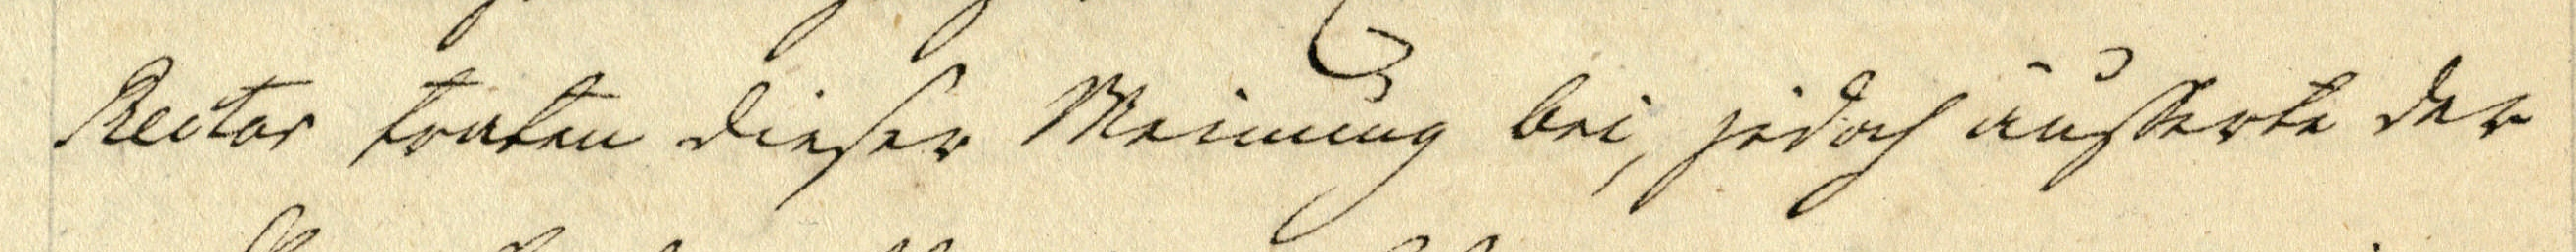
Rector traten dieser Meinung bei, jedoch äusserte der
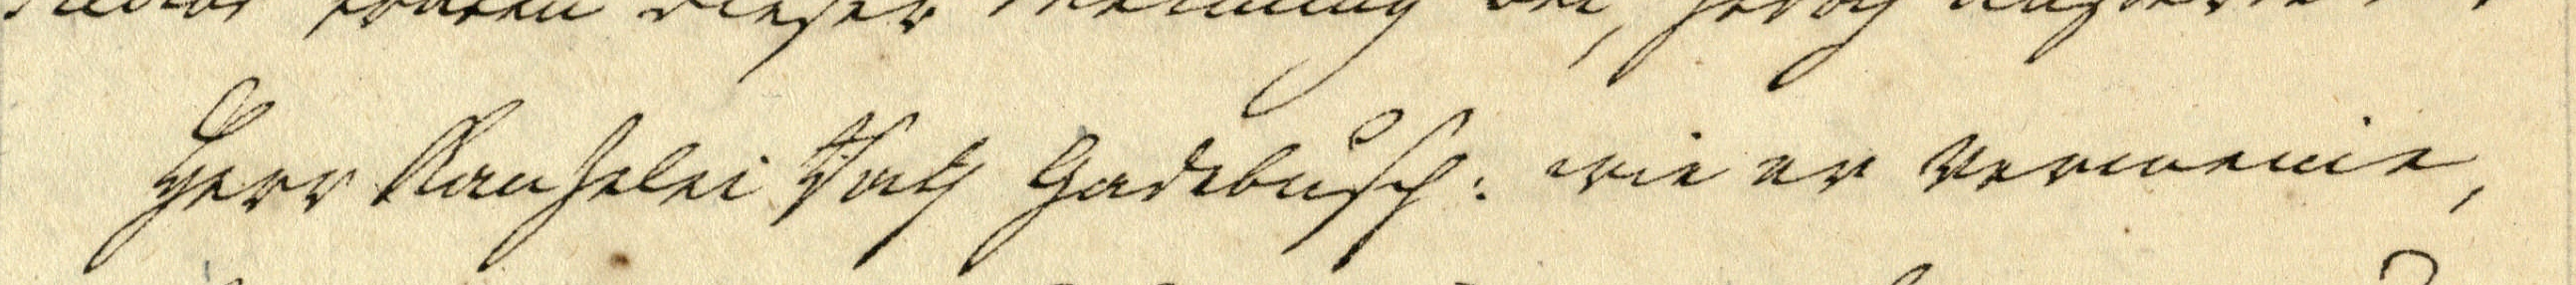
Herr Kanzelei Rath Gadebusch: wie er vermeine
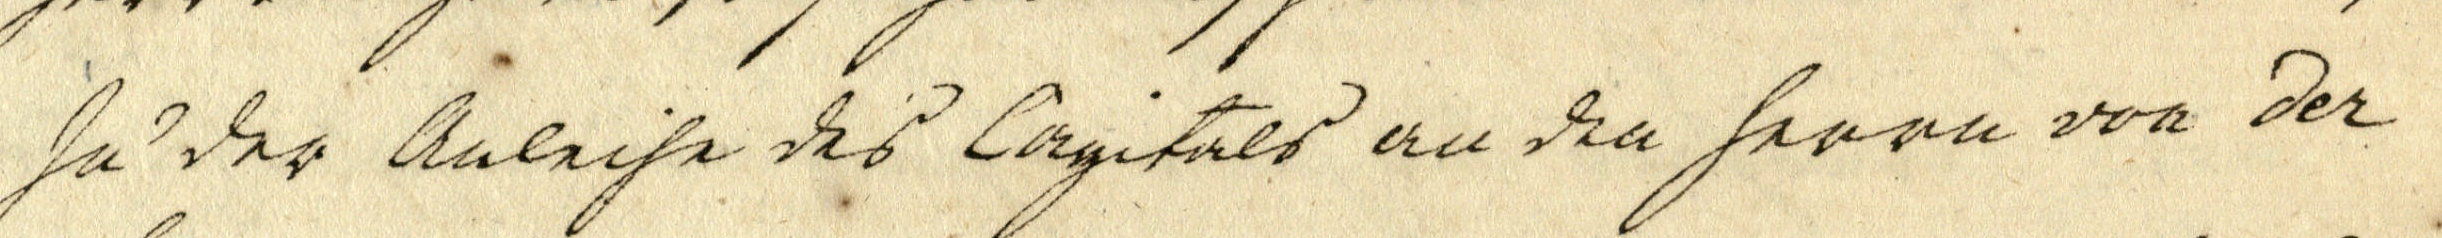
zu der Anleihe des Capitals an den herrn von der
